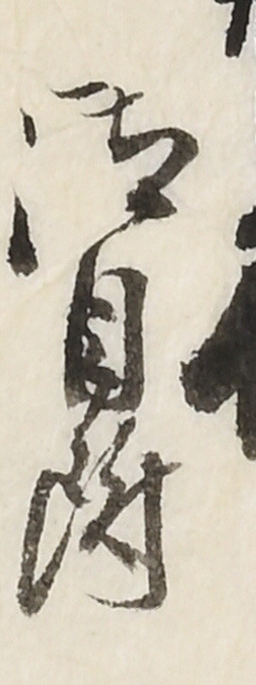御目附
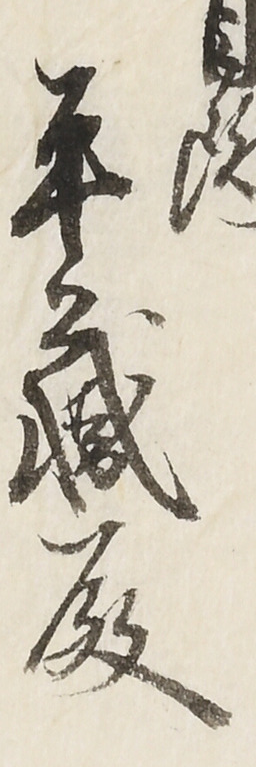平蔵殿
